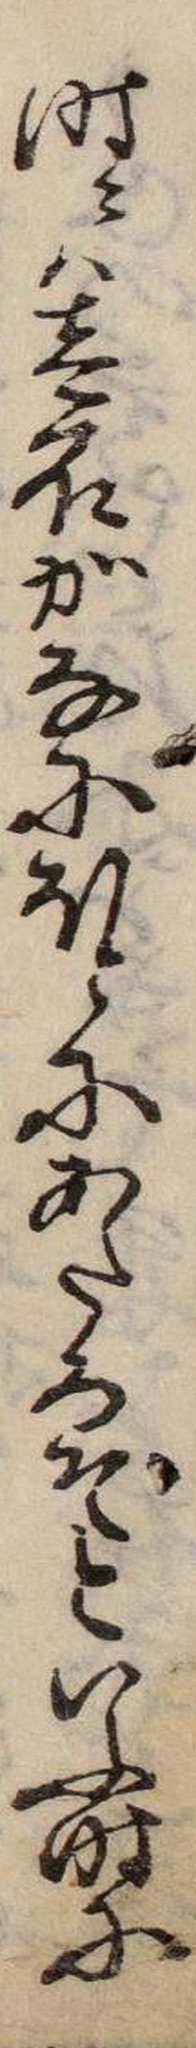時には壱石がなにほとにあたるぞといふ時に
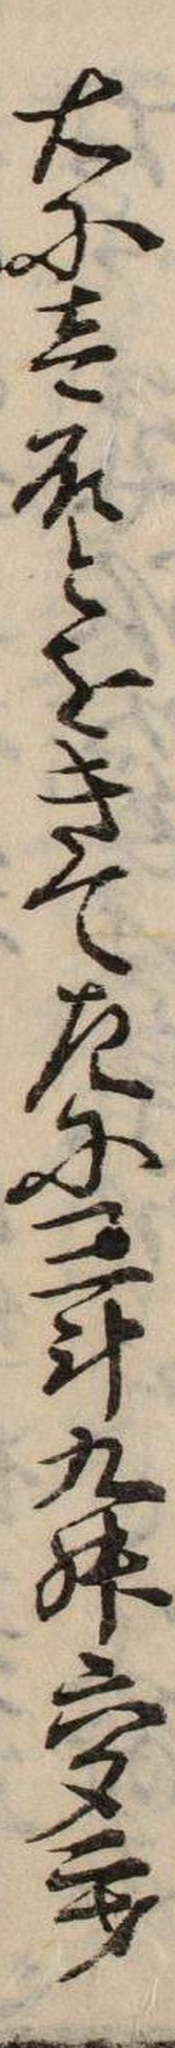右に壱石とをきて左に三斗九舛六勺二才
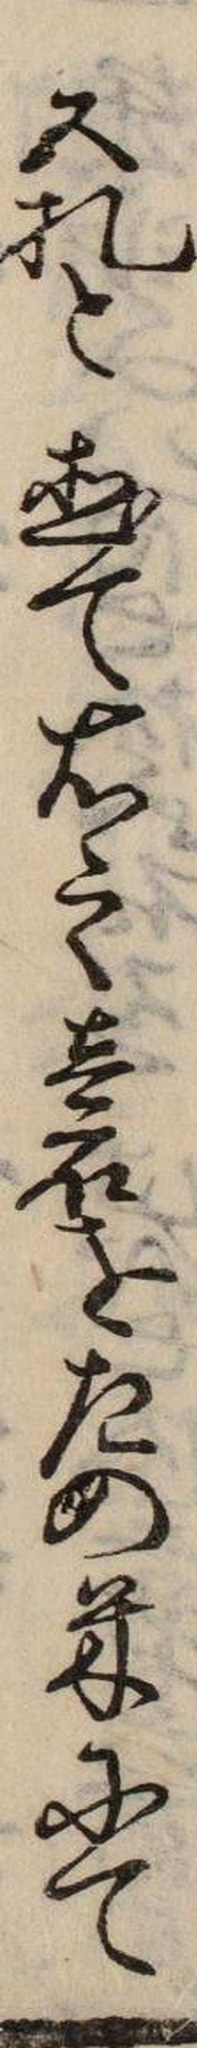五札と置て右の壱石を左の米にて
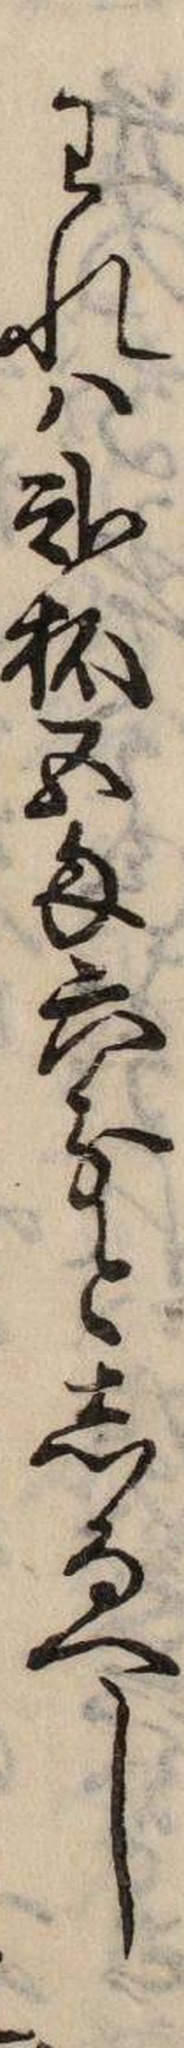われは弐拾五匁六分としるへし
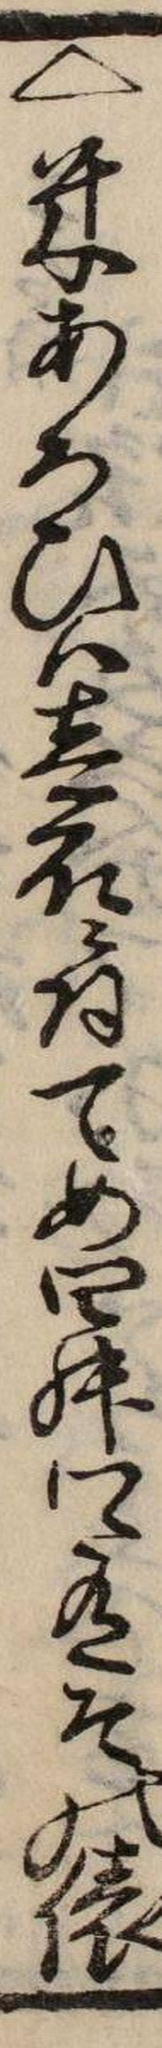△米あろひは壱石に付てめ四舛つゝ有その俵
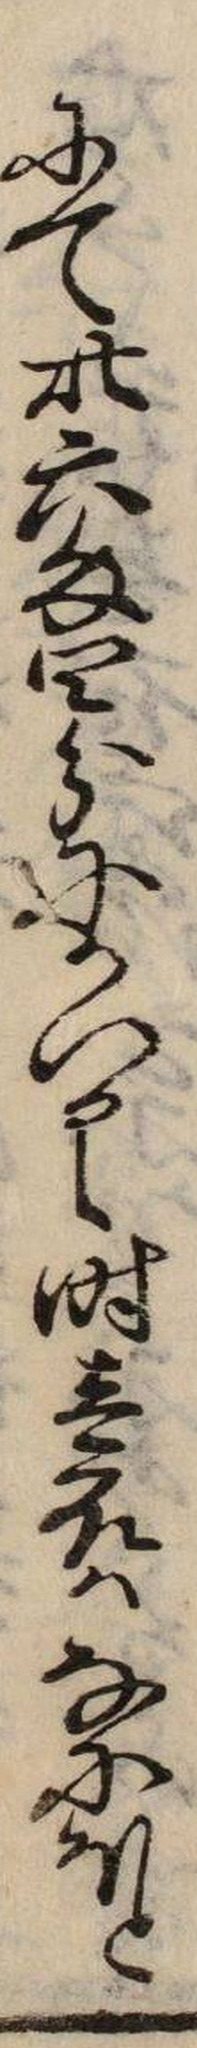にて卅六匁四分にかい申候時壱石はなにほと
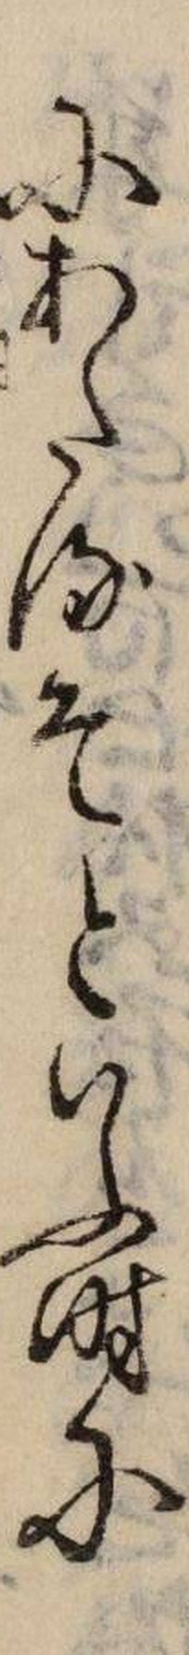にあたるそといふ時に
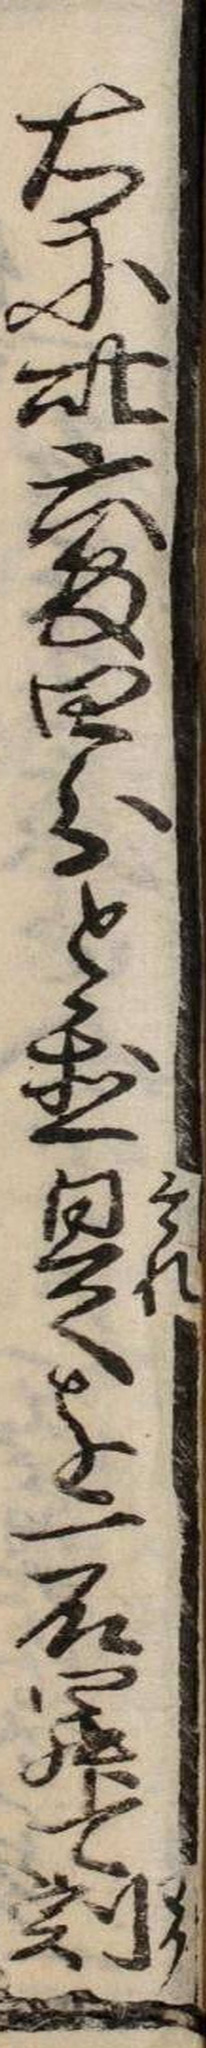右に卅六匁四分と置是を一石四舛て刻へし
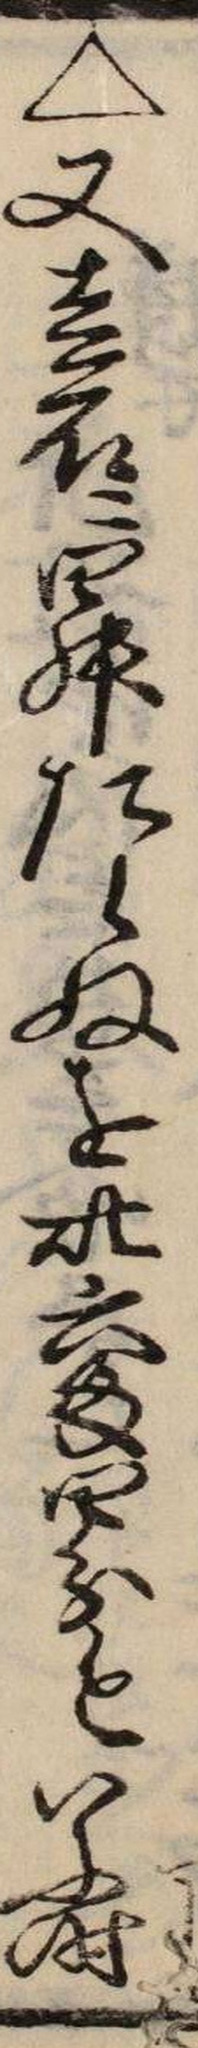△又壱石に四舛たらぬを卅六匁四分といふ時
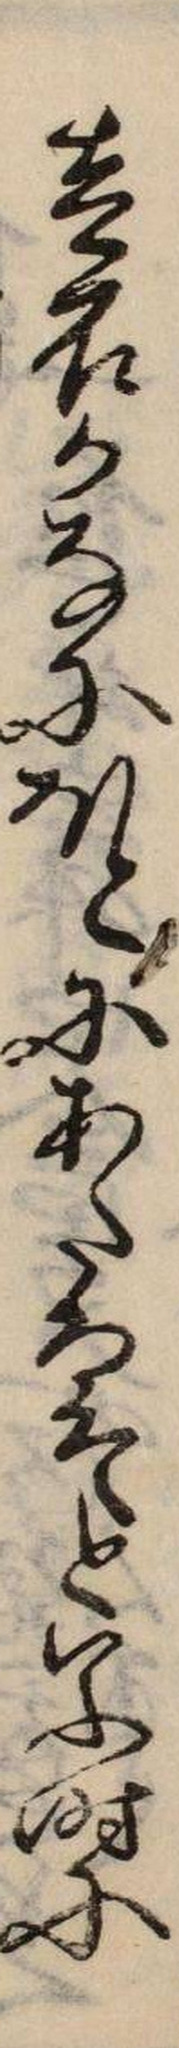壱石かなにほとにあたるそといふ時に
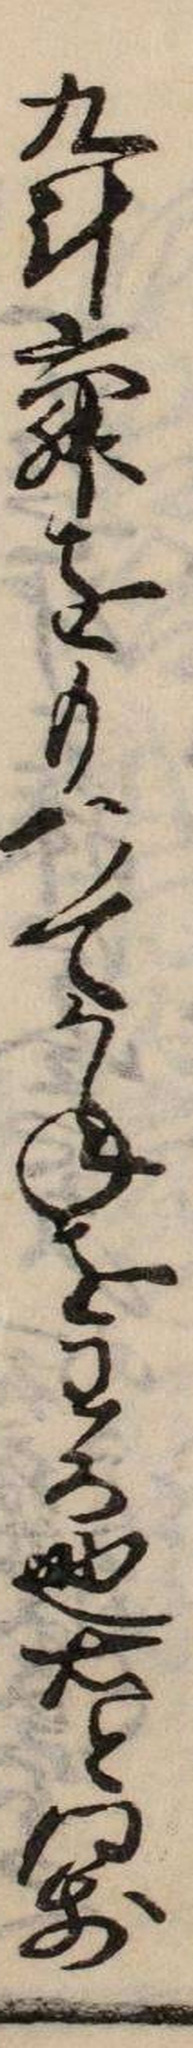九斗六舛をもつてかねをわる也右と同前
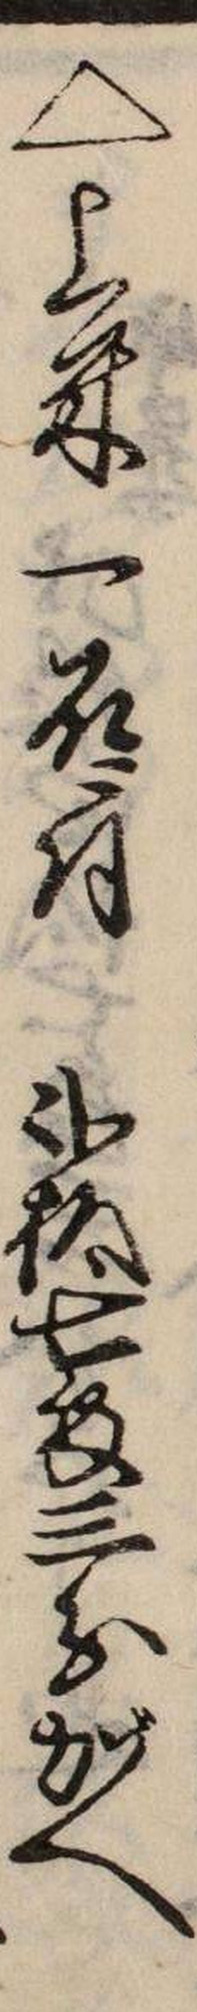△上米一石に付弐拾七匁三分がへ
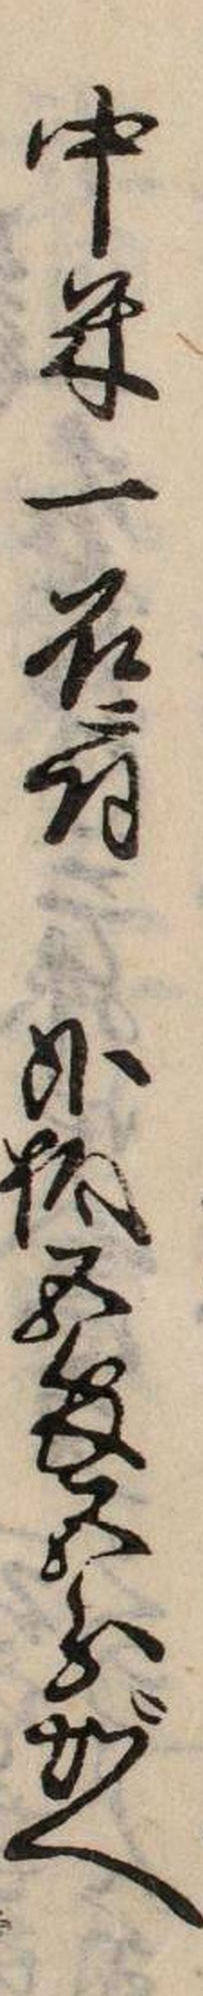中米一石に付弐拾五匁五分がへ
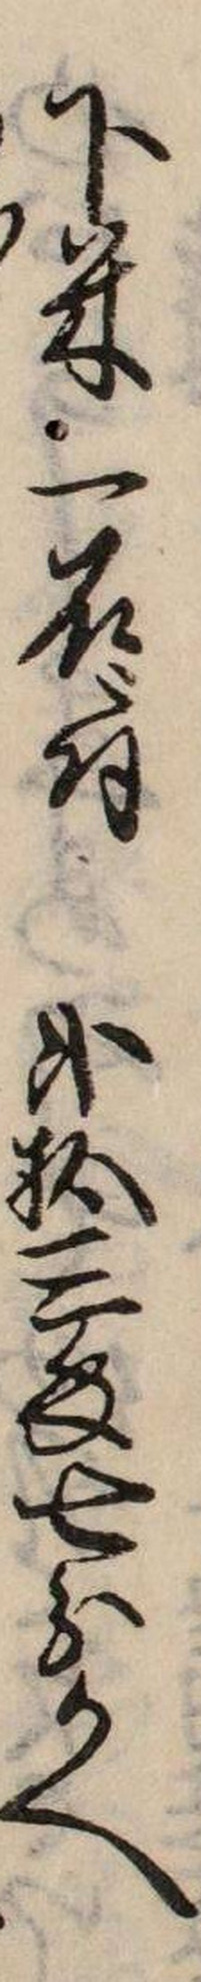下米一石に付弐拾三匁七分かへ
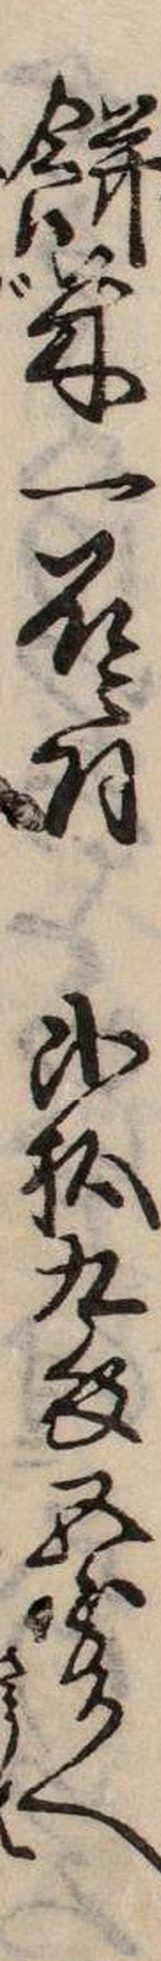餅米一石に付弐拾九匁五分かへ
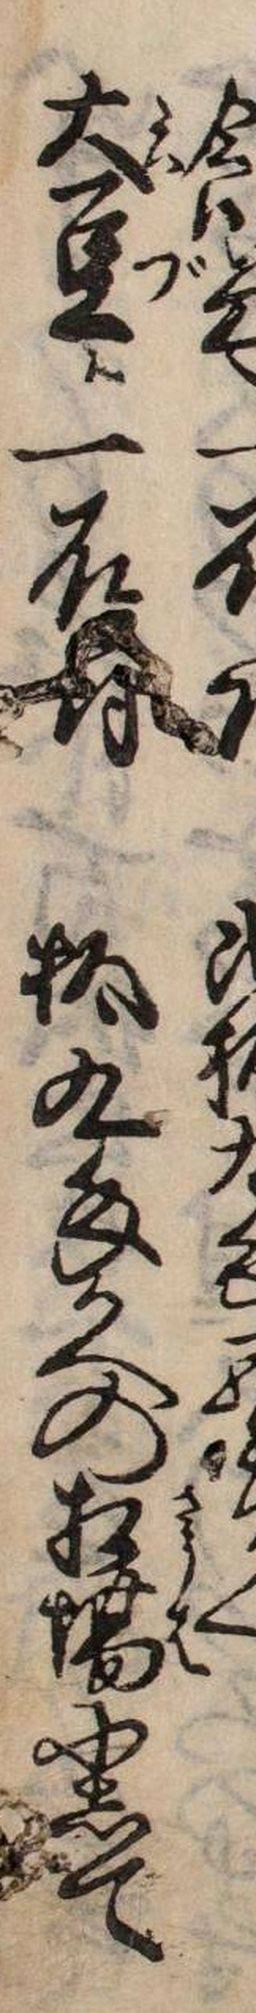大豆一石に付拾九匁かへの相場にして
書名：塵劫記（寛永11年自跋、京都府立京都学・歴彩館追貴8）
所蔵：京都府立京都学・歴彩館 国文学研究資料館
